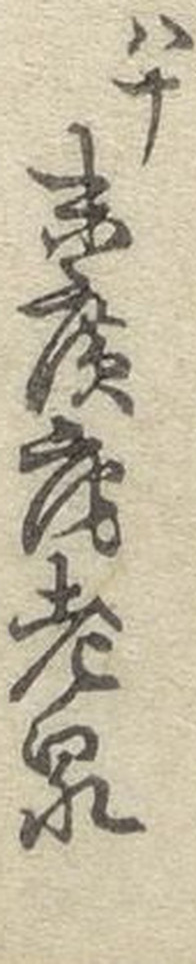末広庵老泉
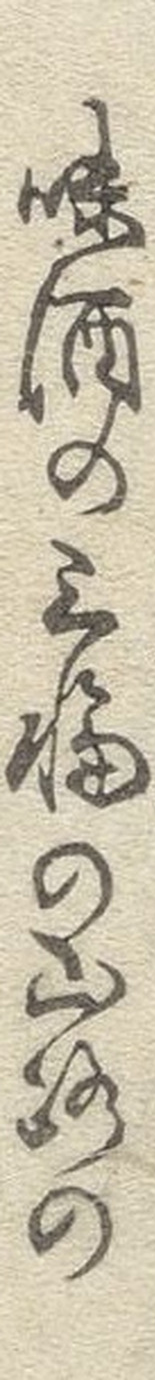味酒の三輪の山路の
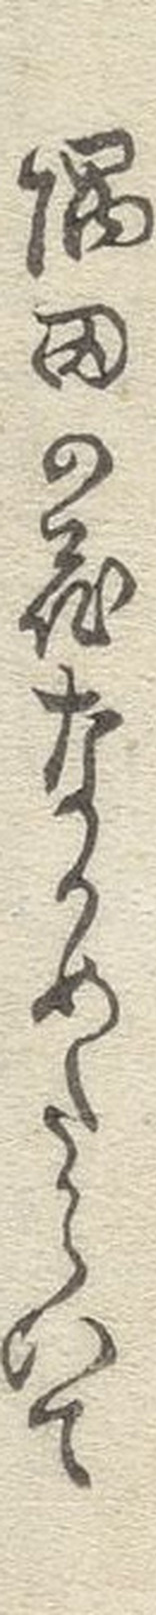隅田の花なかめたらいて
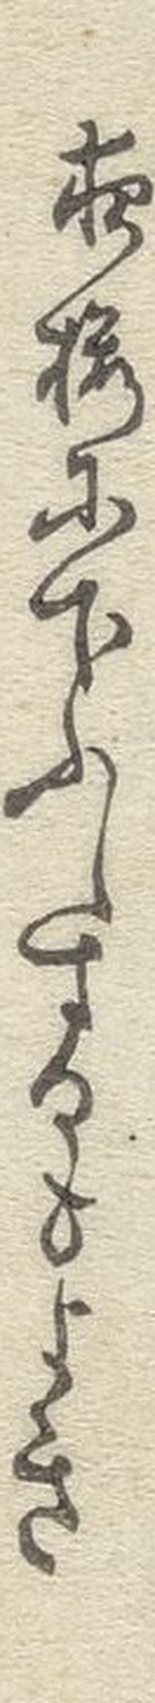夜桜に下ふしするもよき
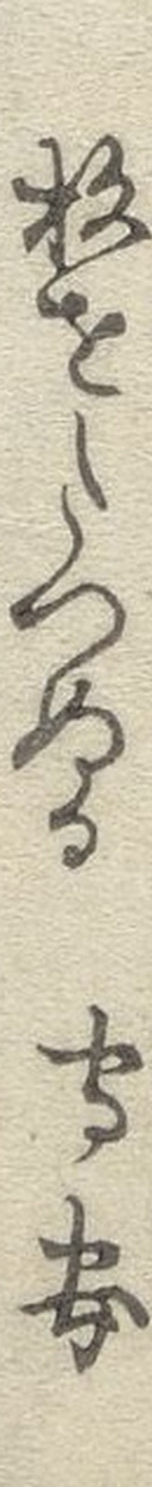杉をたつぬる守安
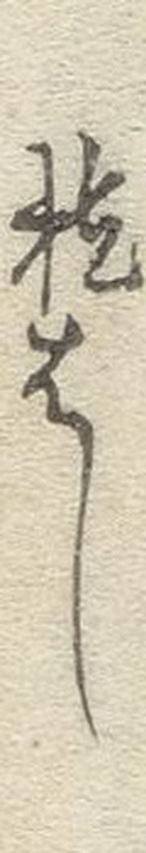枕はし
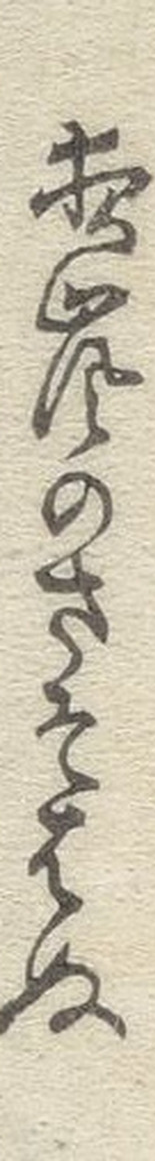夜嵐のさそはぬ
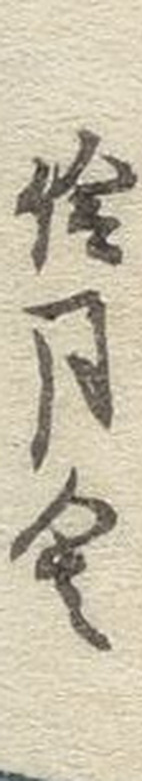伶月舎
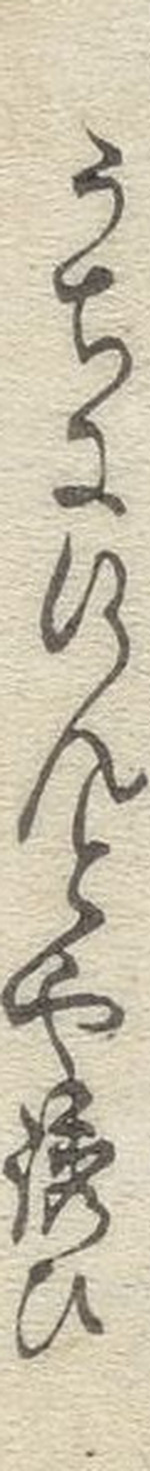うちに行んとや誘ひ
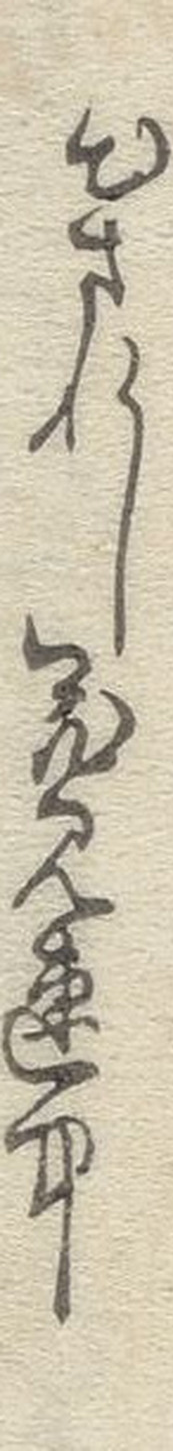だされし花見連中
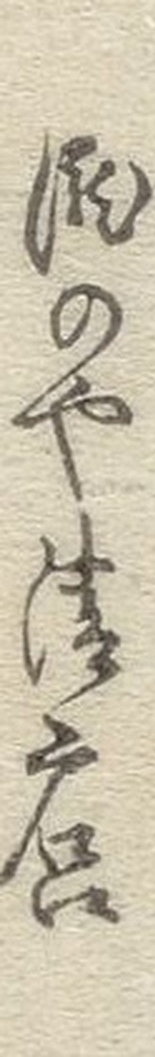瀧のや清麿
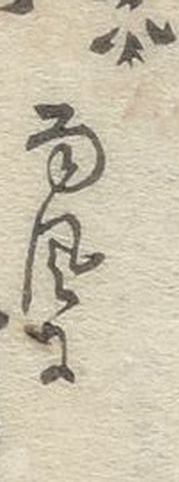雨風に
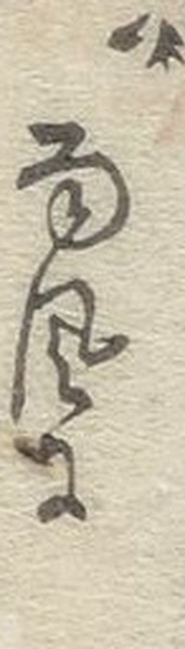雨風に
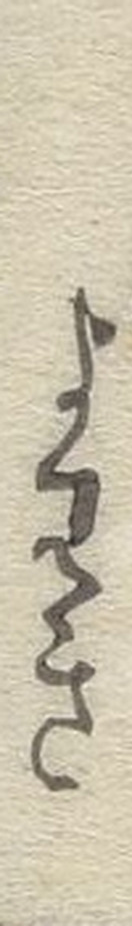よわき
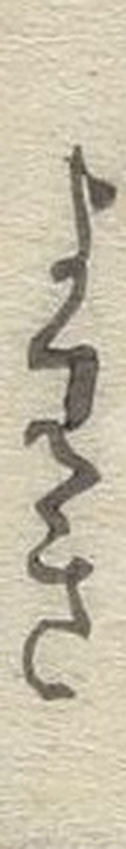よわき
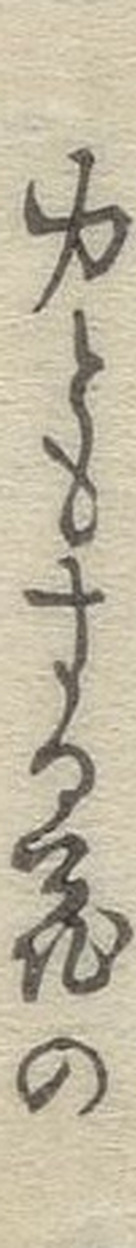力ともする花の
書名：Picture Album of People with Kyōka (Light Verse) (Kyōka shiki jinbutsu 狂歌四季人物)
